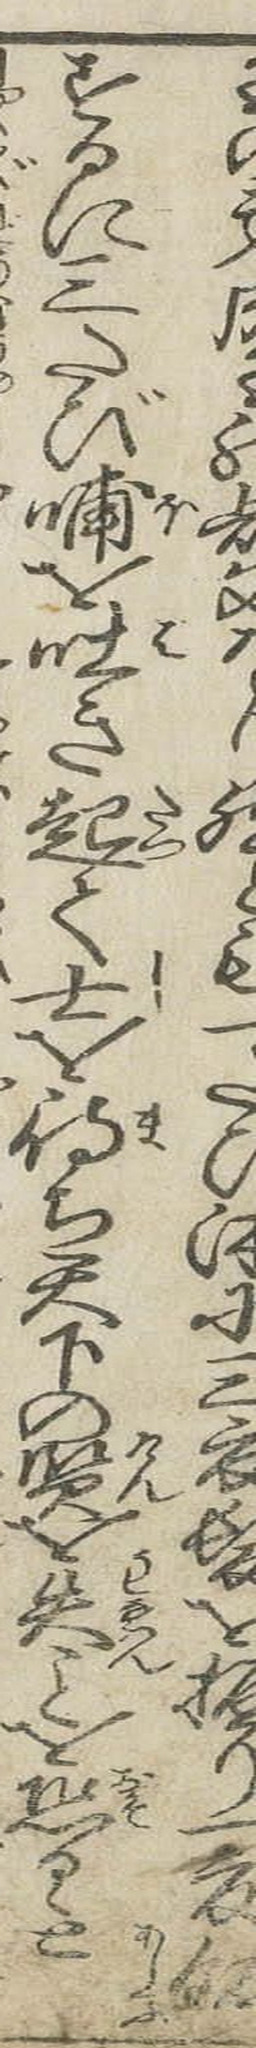するに三たび晡を吐き起て士を待ち天下の賢を失ことを恐るゝと
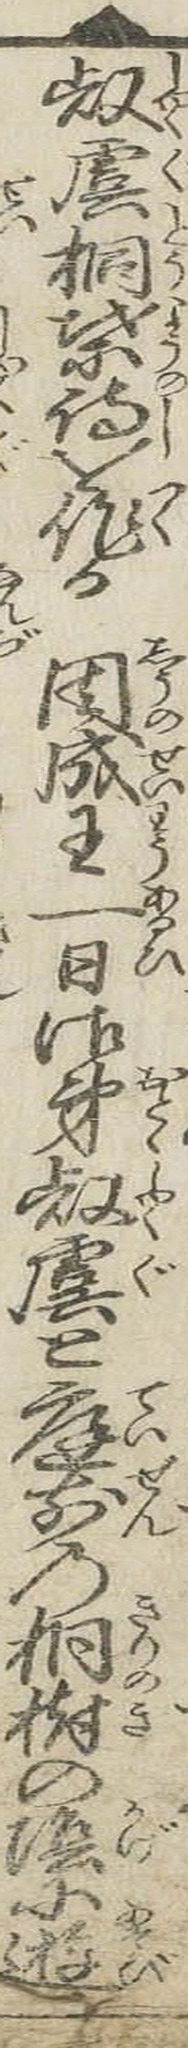叔虞桐葉の詩を作る周成王一日御弟叔虞と庭前の桐樹の陰に遊
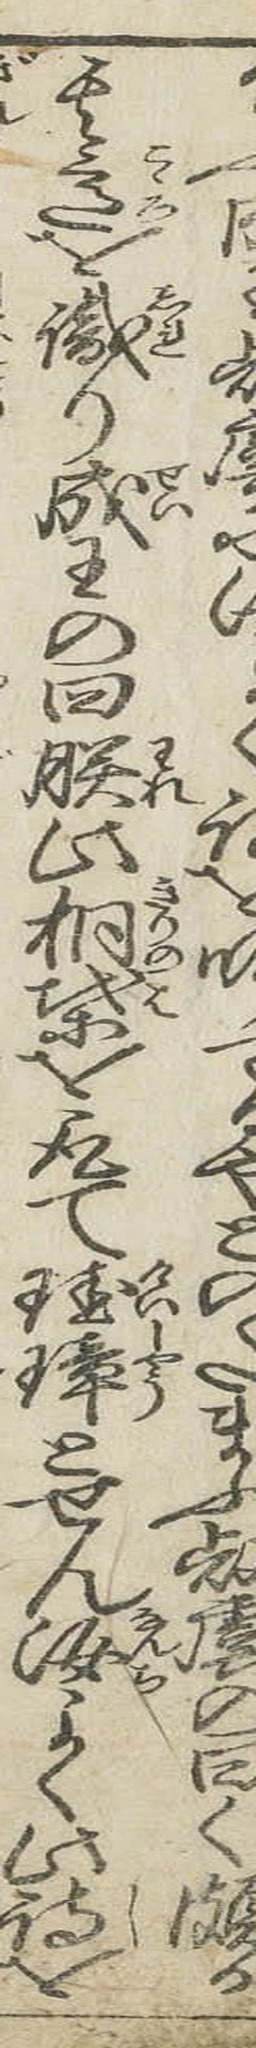其意を識り成王の曰朕此桐葉を取て圭璋とせん汝よく此詩を
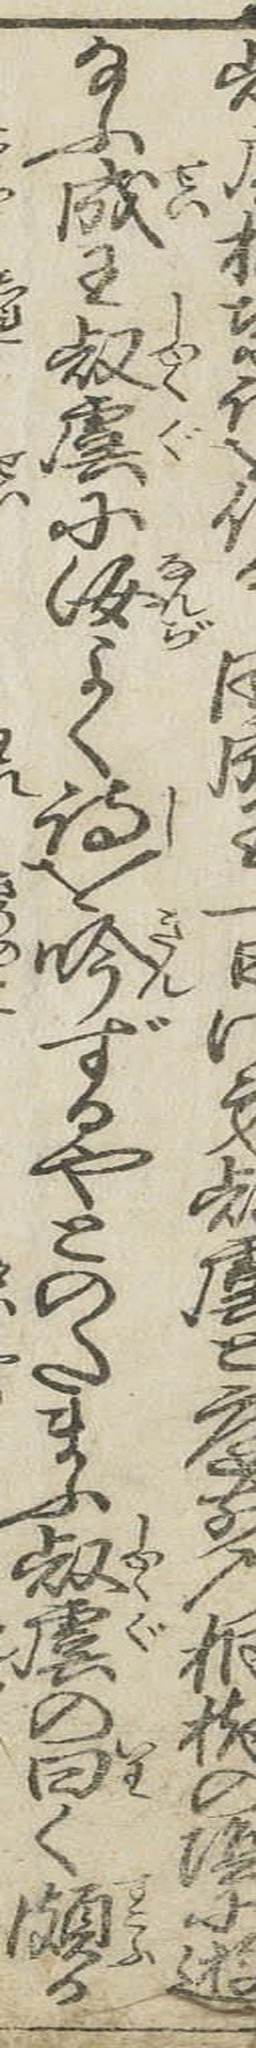給ふ成王叔虞に汝よく詩を吟ずるやとのたまふ叔虞の曰く頗る
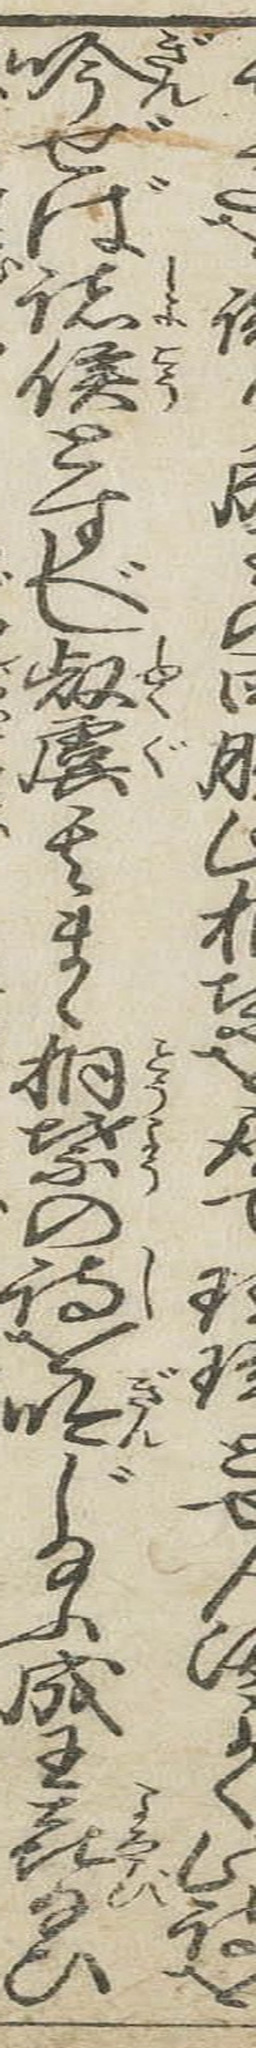吟ぜば諸侯とすべし叔虞其まゝ桐葉の詩を吟じ給ふ成王喜給ひ
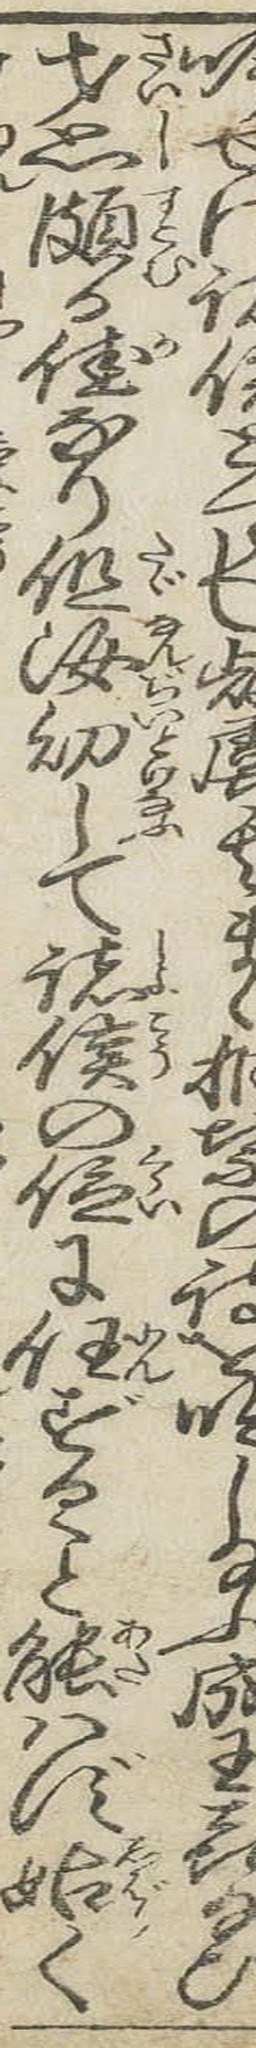才思頗る佳なり但汝幼して諸侯の位に任ずること能はず姑く
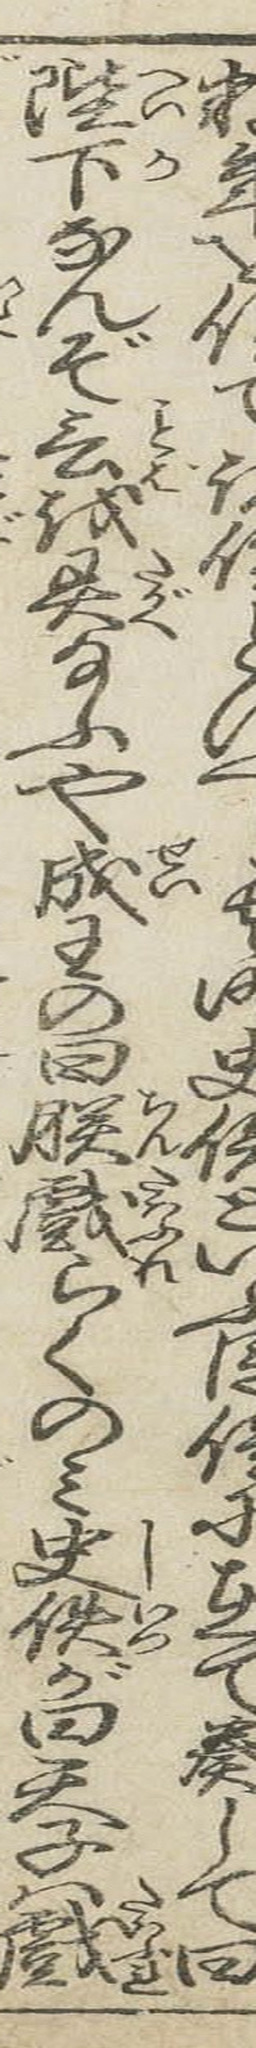陛下なんぞ言を異給ふや成王の曰朕戯らくのみ史佚が曰天子は戯
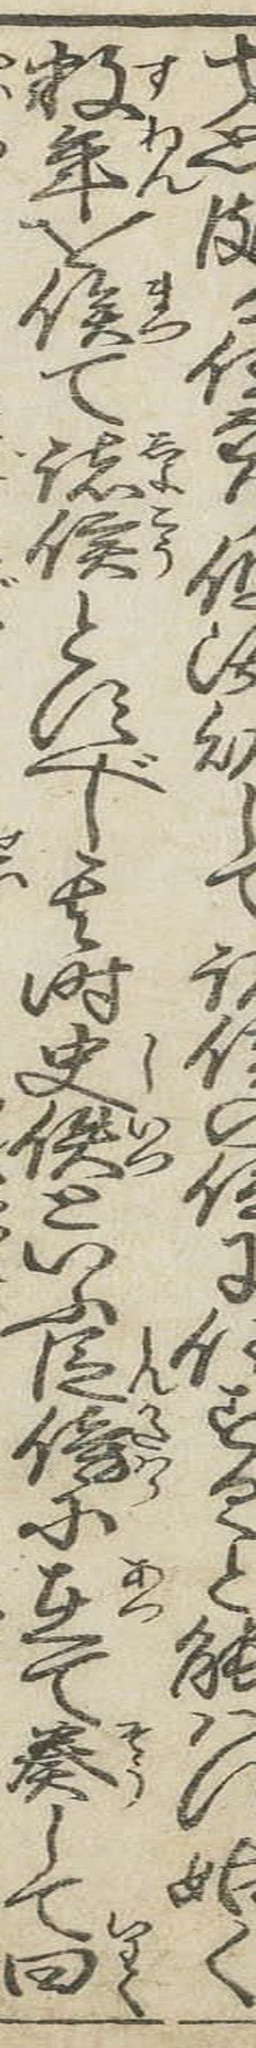数年を俟て諸侯とすべし其時といふ臣傍に在て奏して曰
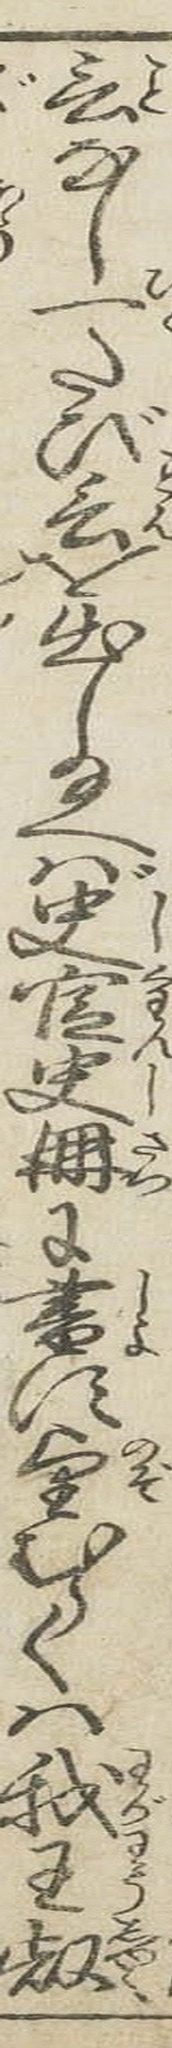言なし一たび言を出し給へば史官史冊に書す望むらくは我王叔
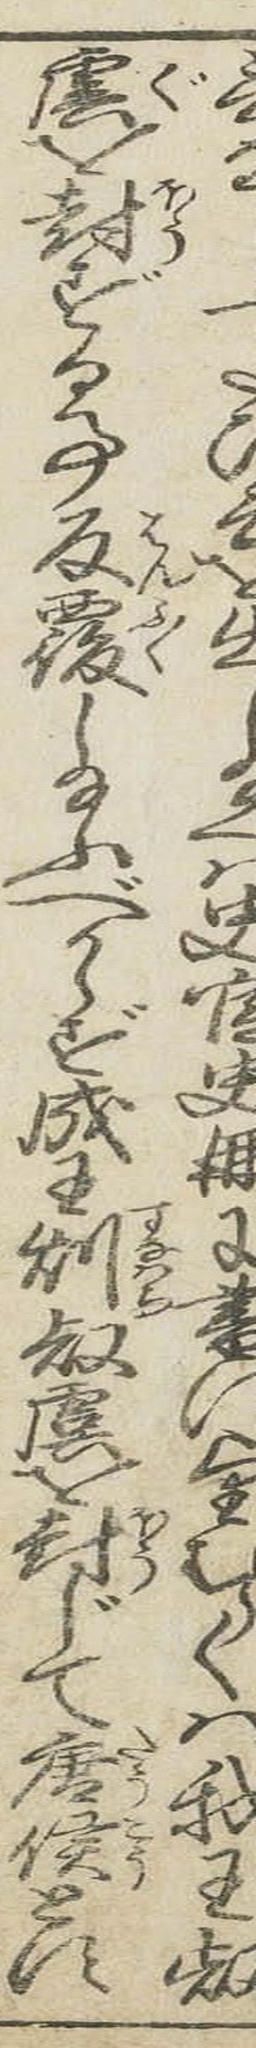虞を封ずる事反覆し給ふべからず成王則叔虞を封じて唐侯とす
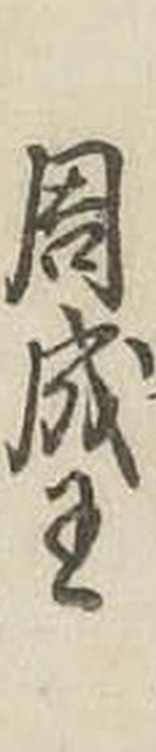周成王
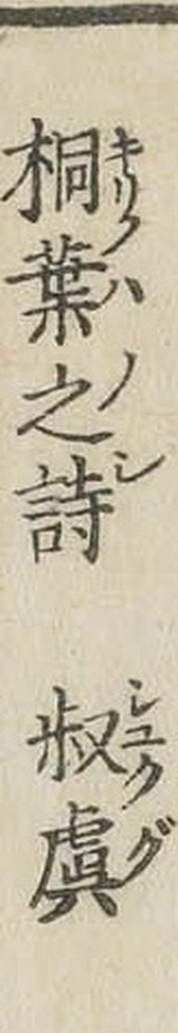桐葉之詩叔虞

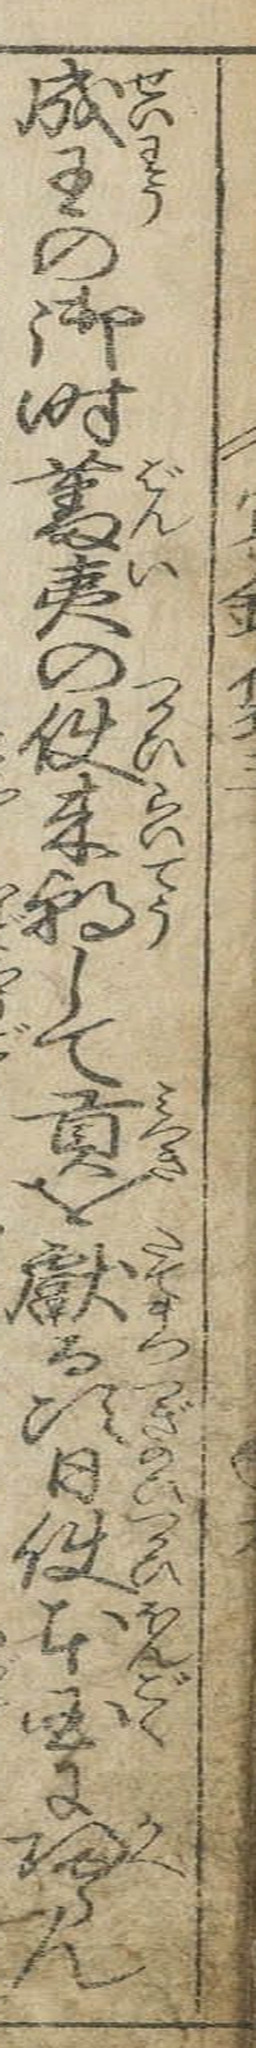成王の御時蕃夷の使来朝して貢を献る次日使本国に帰らん
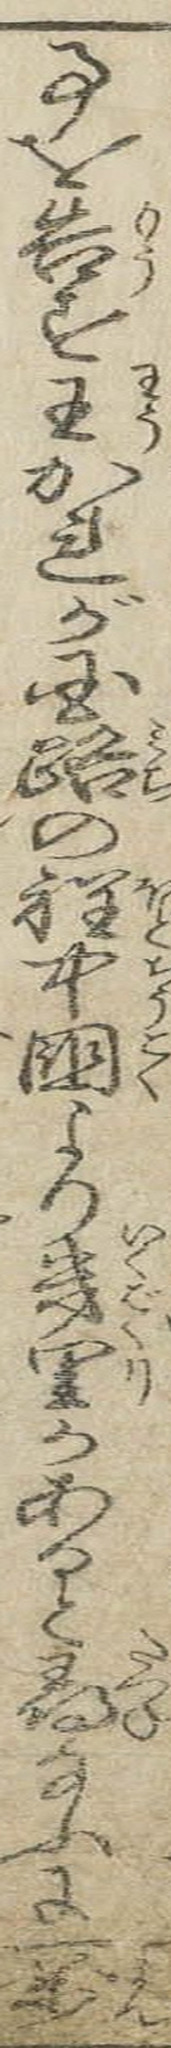事を告す王かれが国路の程中国より幾里かあると尋給ふに一万
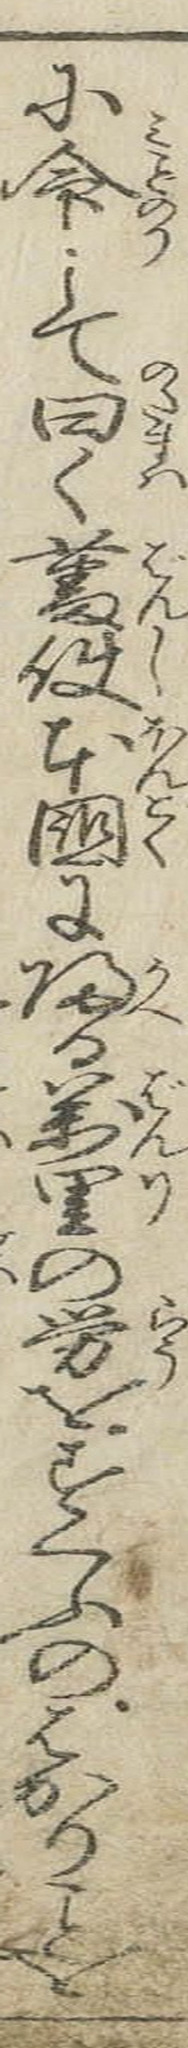に命して曰く蕃視本国に帰る万里の労を。すくふの。はかりことを
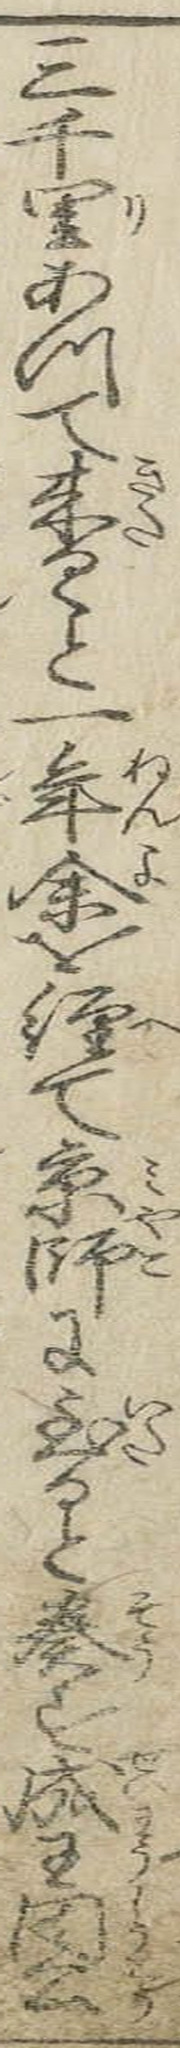三千里あつて来るゝと一年余を経て京師に至ると奏す成王周公
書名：絵本写宝袋 9巻 5之巻
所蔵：東京学芸大学教育コンテンツアーカイブ
